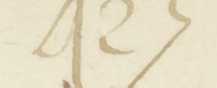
427
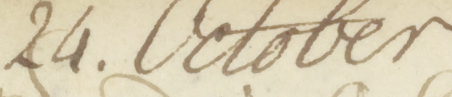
24. October
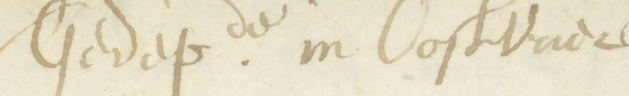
Gedepde. in Oostvrie
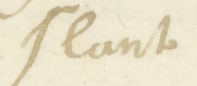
slant
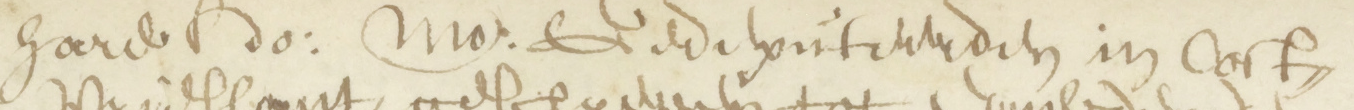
hare Ho:Mo: Gedeputeerden in Oost,,
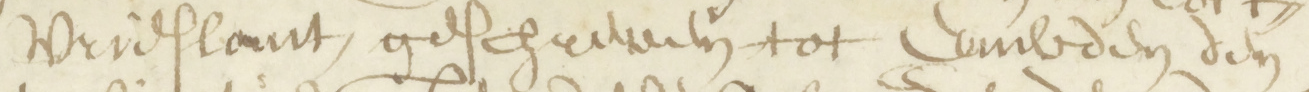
Vrieslant, geschreven tot Embden den
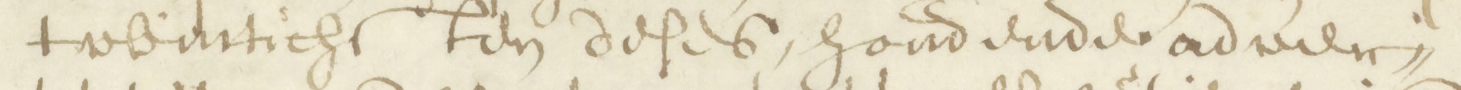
twintichsten deses, houdende adver,,
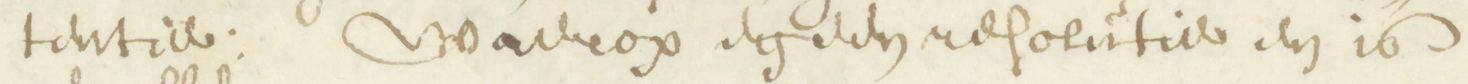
tentie: Waerop egeen resolutie en is
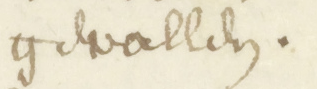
gevallen.
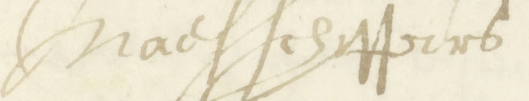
Maesschippers
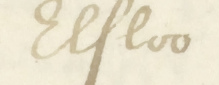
Elsloo
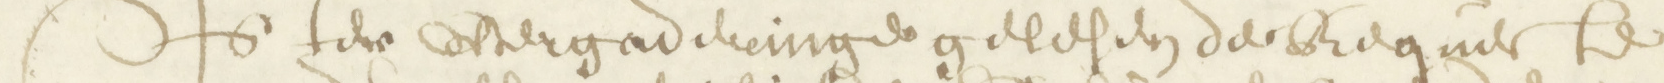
Is ter vergaderinge gelesen de Requeste
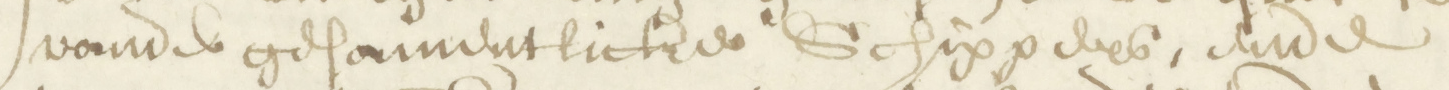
vande gesamentlicke Schippers, ende
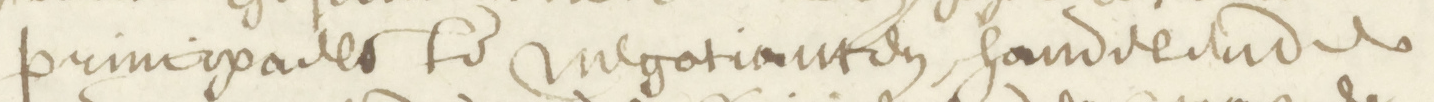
principaelste negotianten, handelende
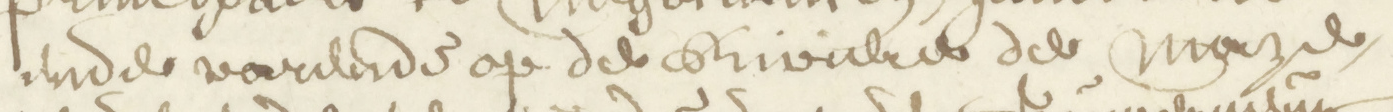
ende varende op de Riviere de Maze,
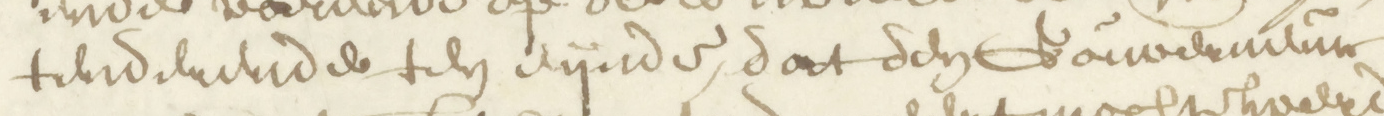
tenderende ten eijnde, dat den Gouverneur
